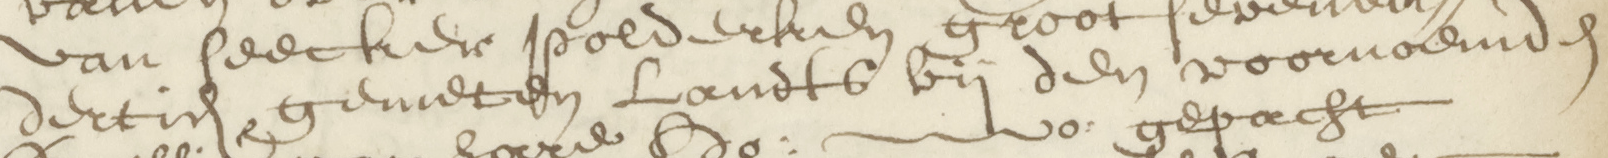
dertich gemeten Landts bij den voornoemde
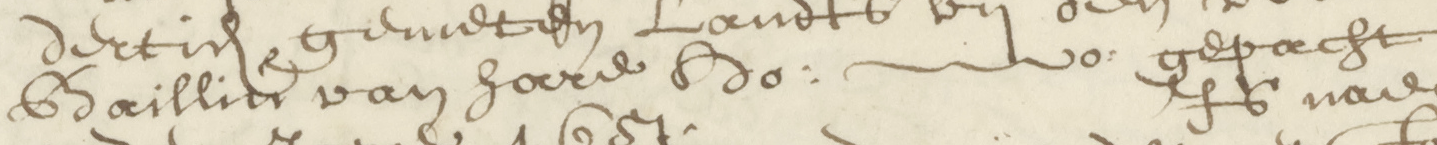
Bailliu van hare Ho: Mo: gepacht
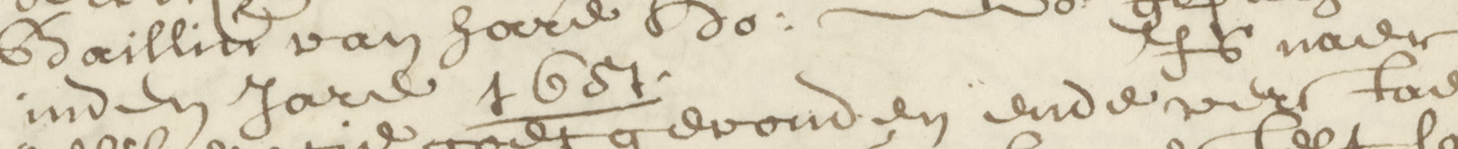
inden Jare 1681. Is naer
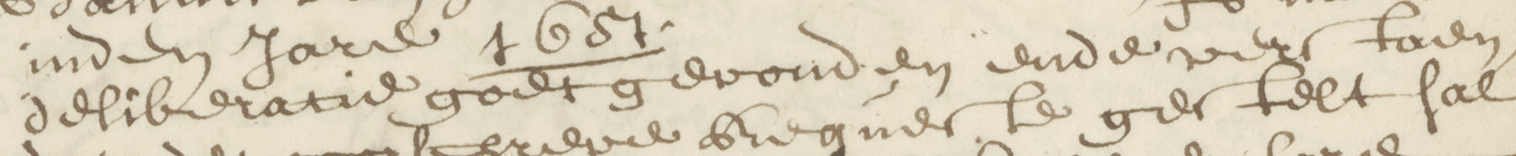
deliberatie goetgevonden ende verstaen
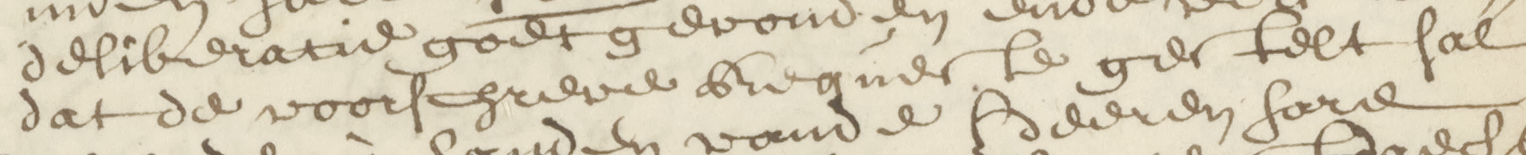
dat de voorschreve Requeste gestelt sal
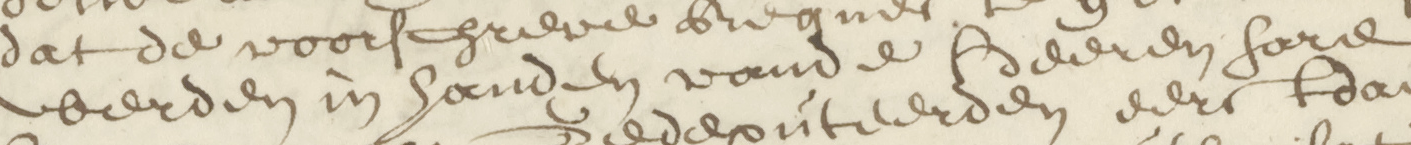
worden in handen vande Heeren hare
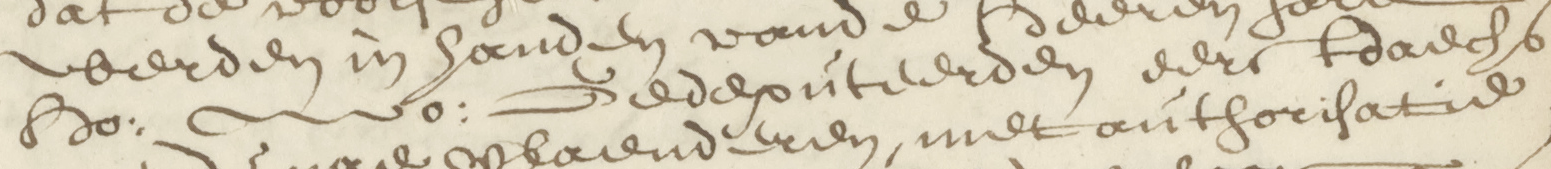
Ho: Mo: Gedeputeerden eerstdaechs
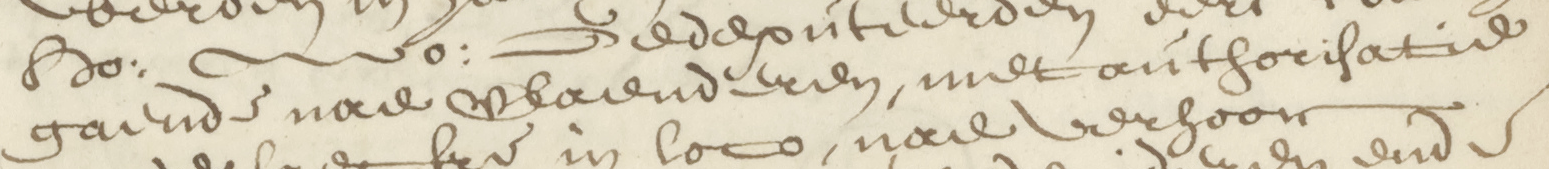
gaende nae Vlaenderen, met authorisatie
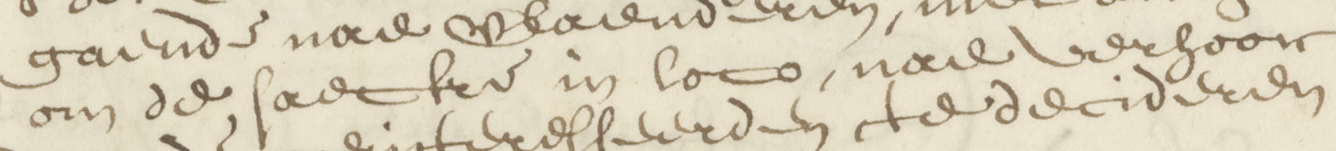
om de saecken in loco, nae verhoor
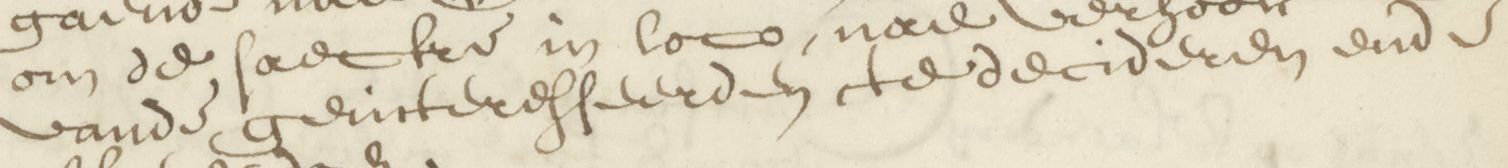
vande geinteresseerden te decideren ende
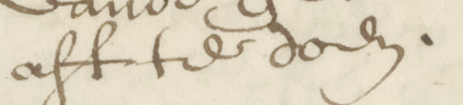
aff te doen.
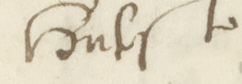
Hulst
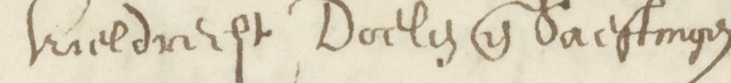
Kieldrecht Doelen & Saeftingen
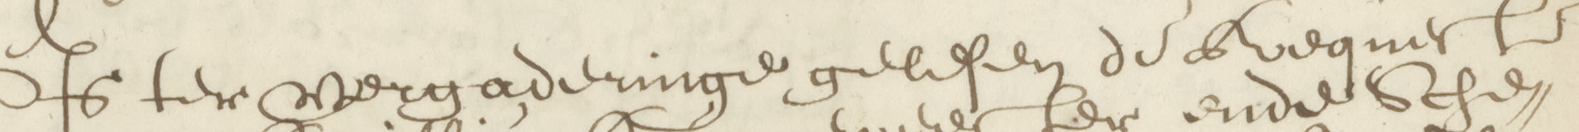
Is ter Vergaderinge gelesen de Requeste
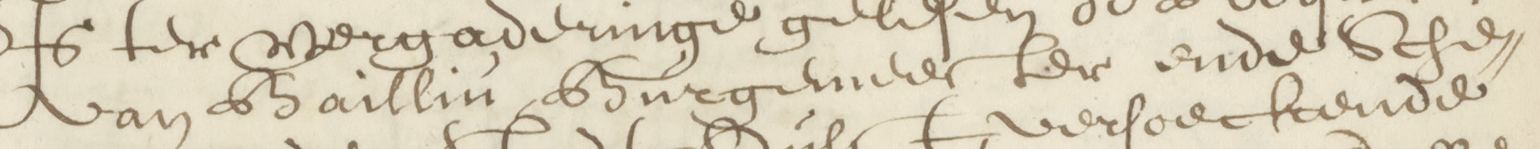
van Bailliu Burgemeester ende Sche„
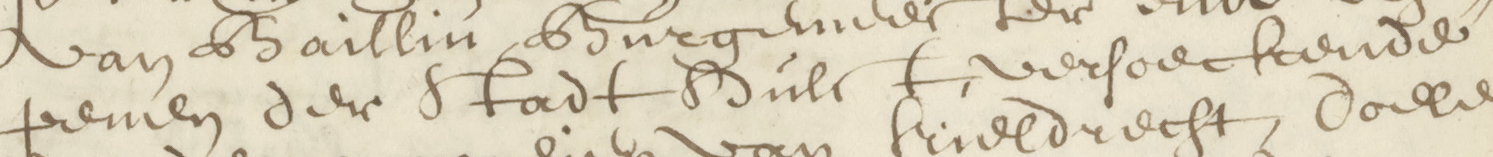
penen der Stadt Hulst, versoeckende
